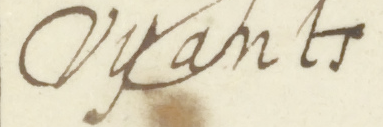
Vyants
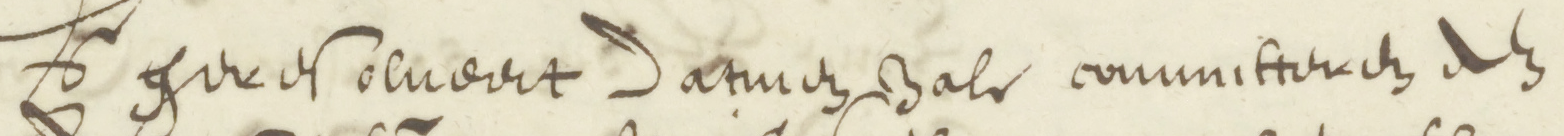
Is geresolueert datmen zal committeren den
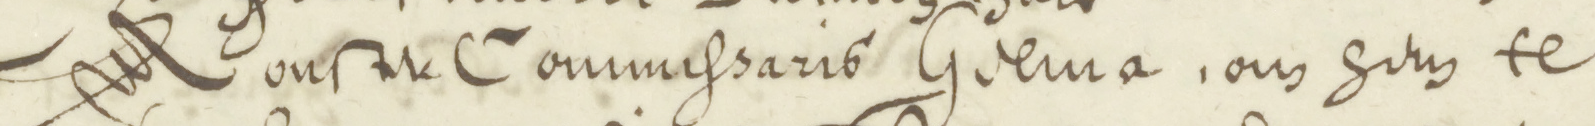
Monster Commissaris Gelma, om hem te
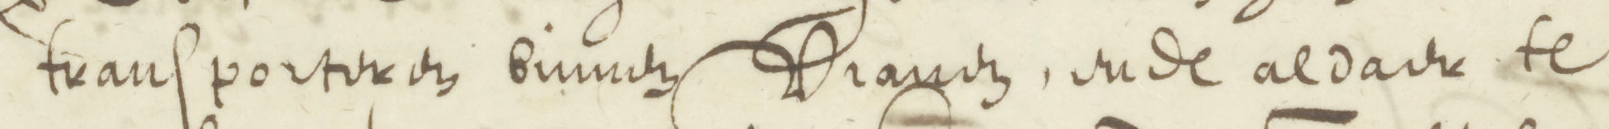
transporteren binnen Vianen, ende aldaer te
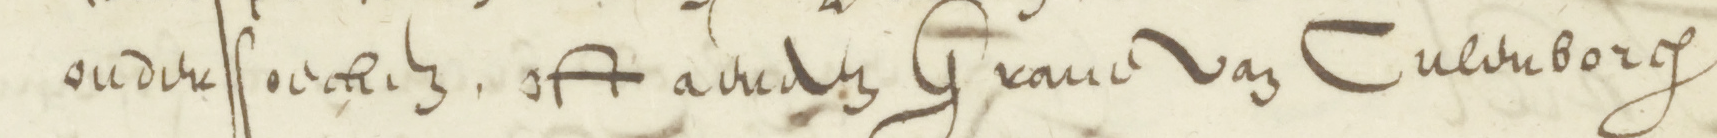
ondersoecken, off aenden Graue van Culenborch
